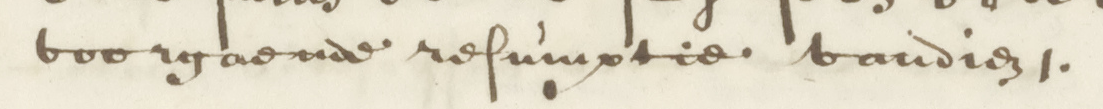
voorgaende resumptie vandien.
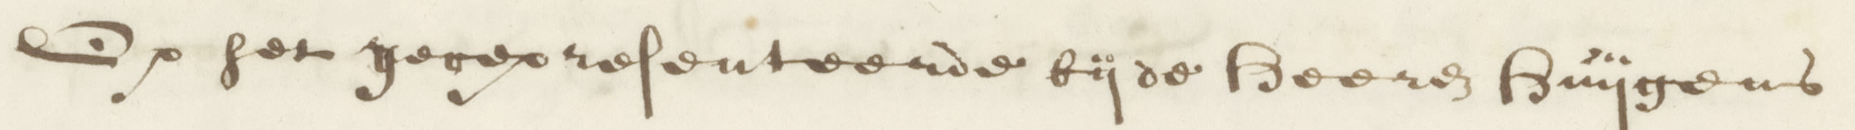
Op het gerepresenteerde bij de Heeren Huijgens
